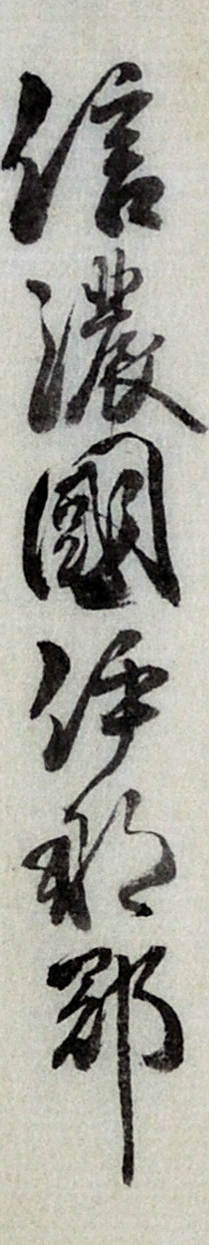信濃国伊那郡
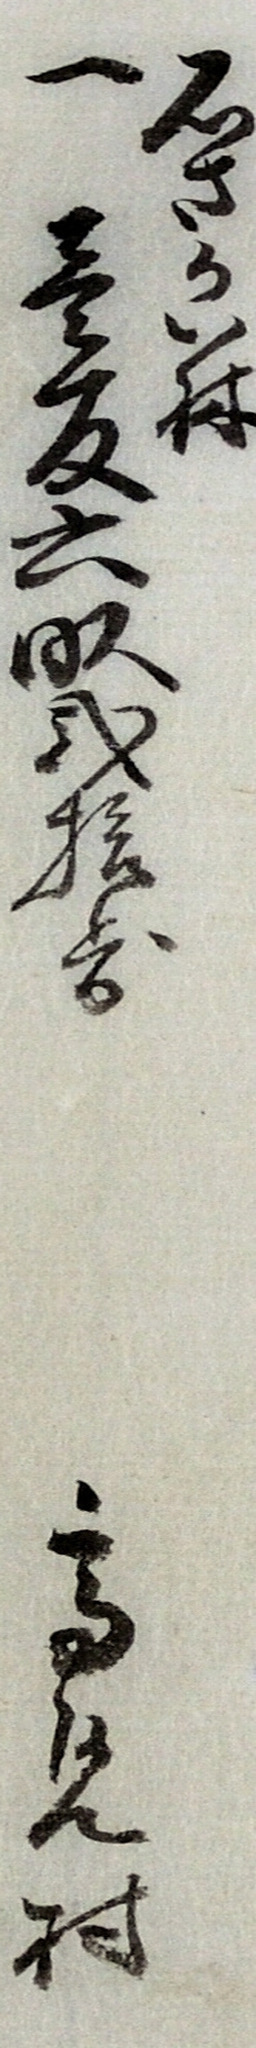一壱反六㽗弐拾歩高見村
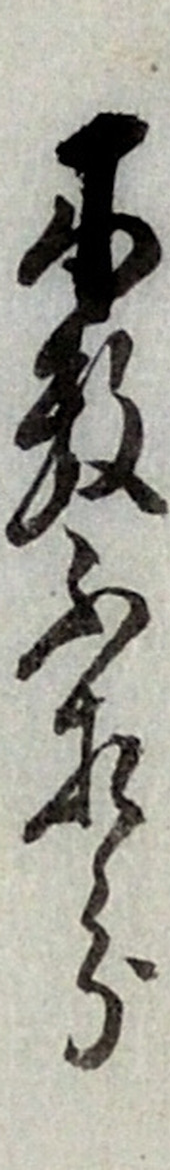木数不相分
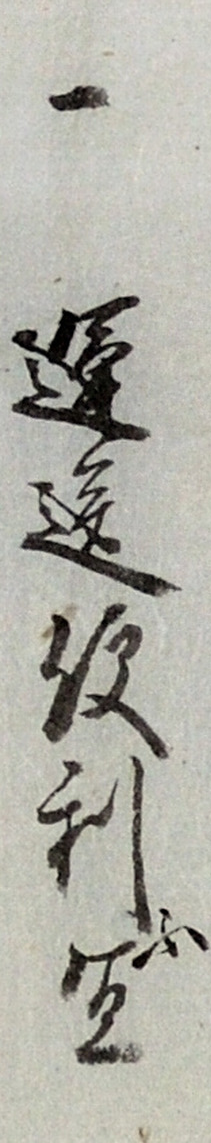一運送便利不宜
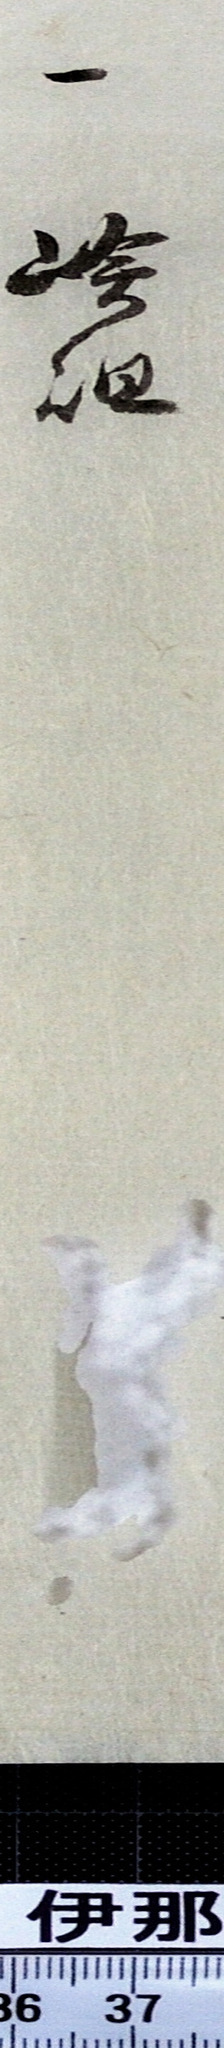一嶮岨

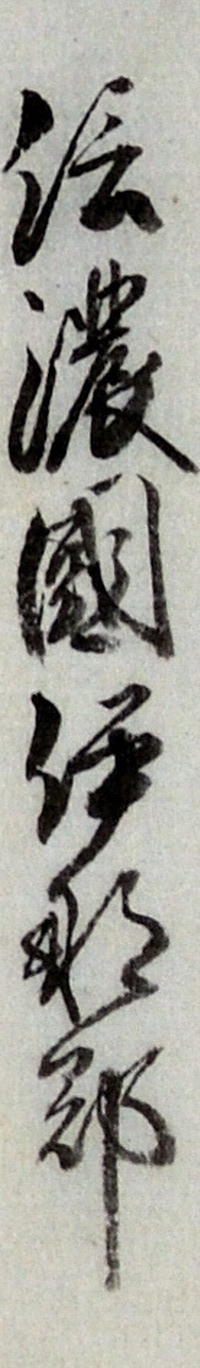信濃国伊那郡
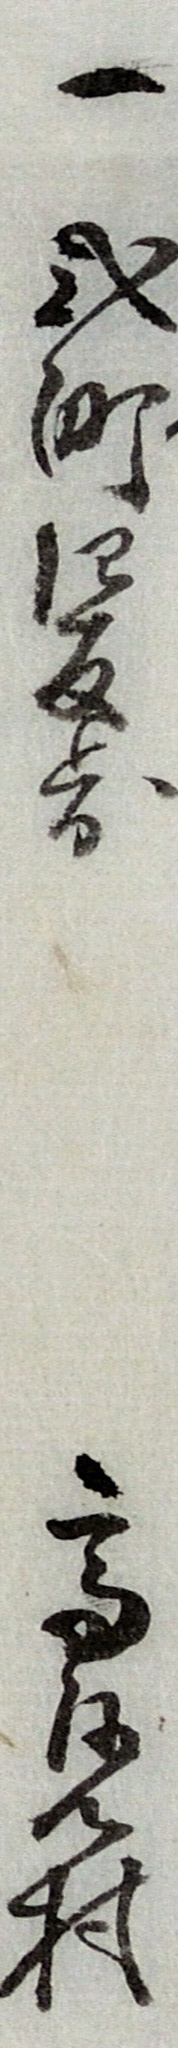一弐町四反歩高見村
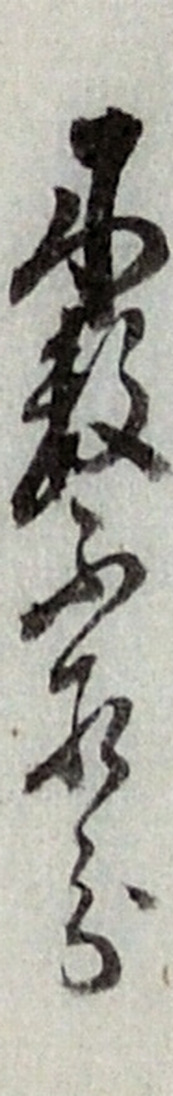木数不相分
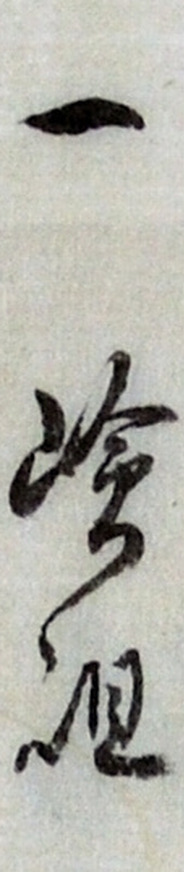一嶮岨
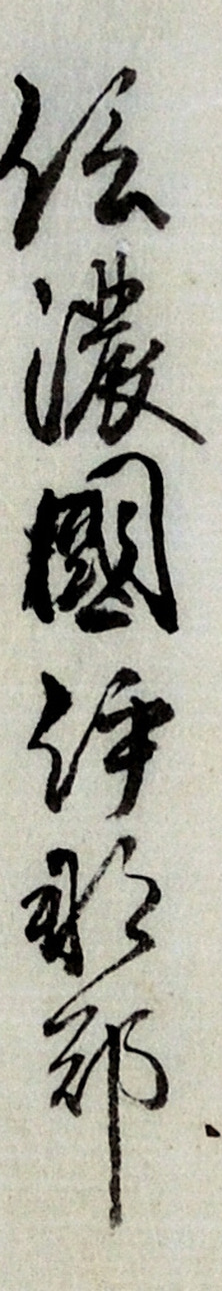信濃国伊那郡
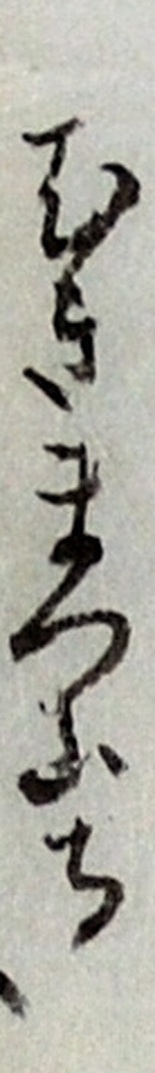むれまつ山寺
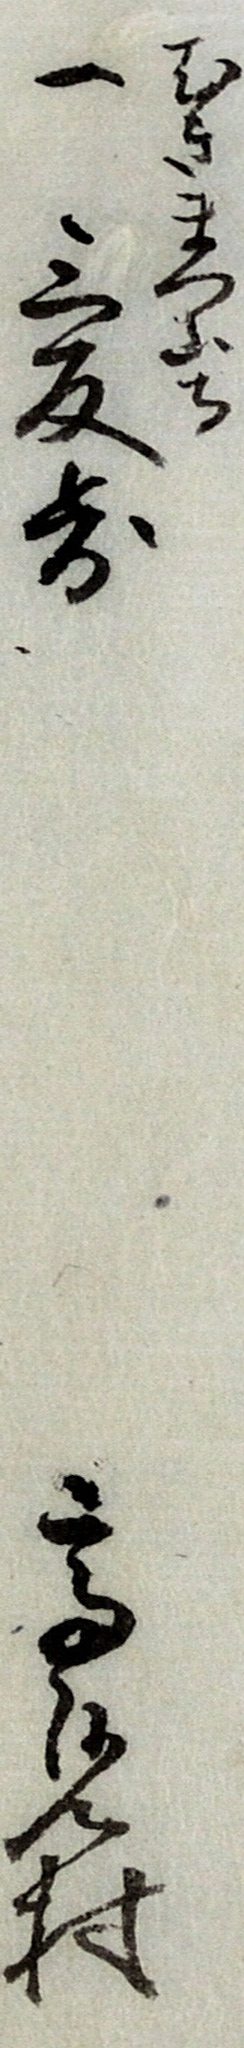一三反歩高見村
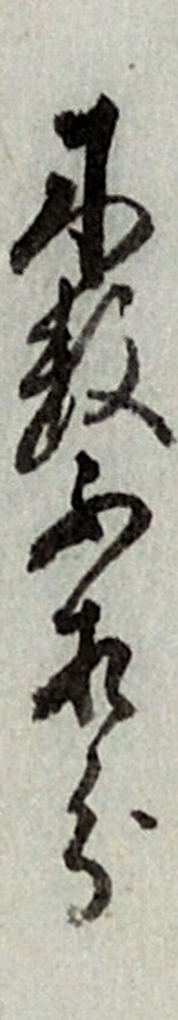木数不相分
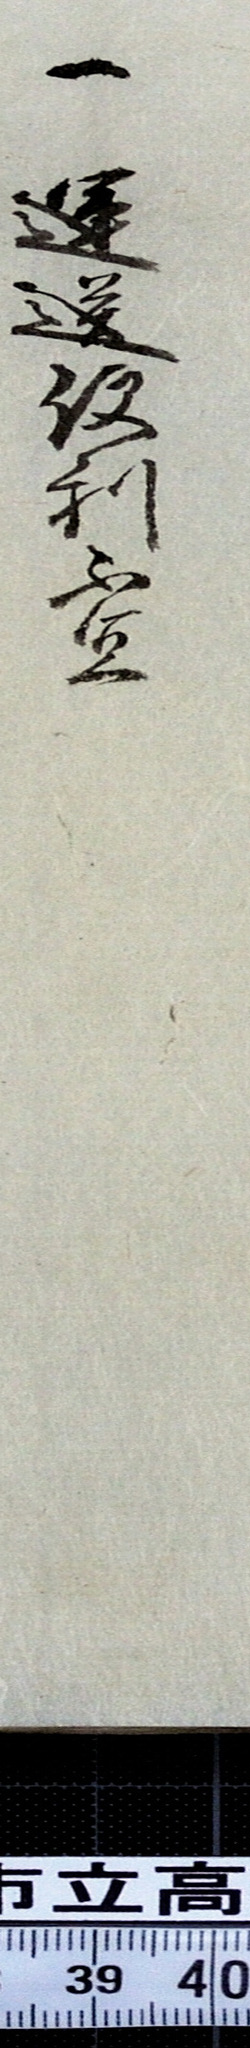一運送便利不宜
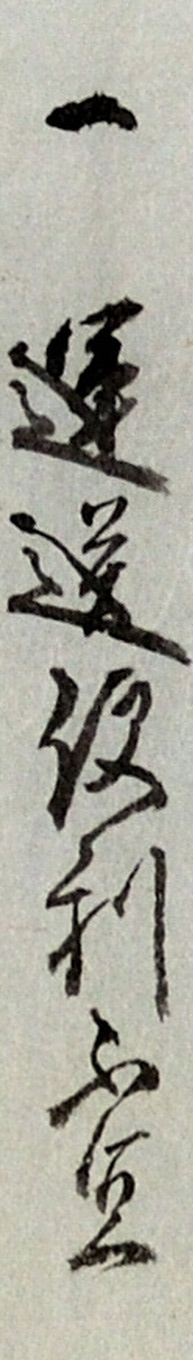一運送便利不宜
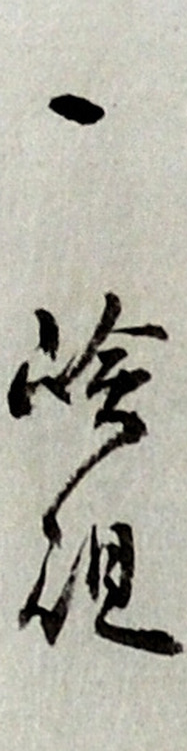一嶮岨
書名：官林反別帳
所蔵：伊那市立高遠町図書館・合同会社AMANE
